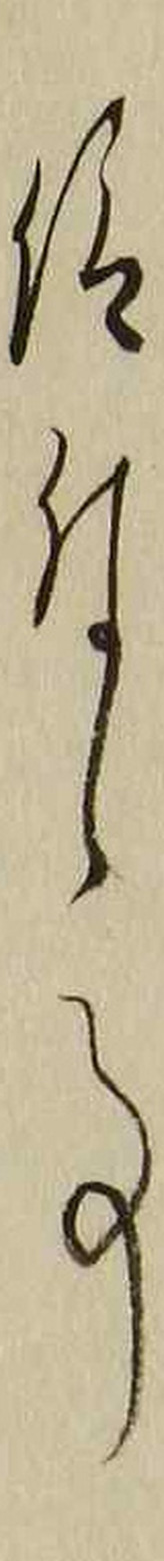仰付候事
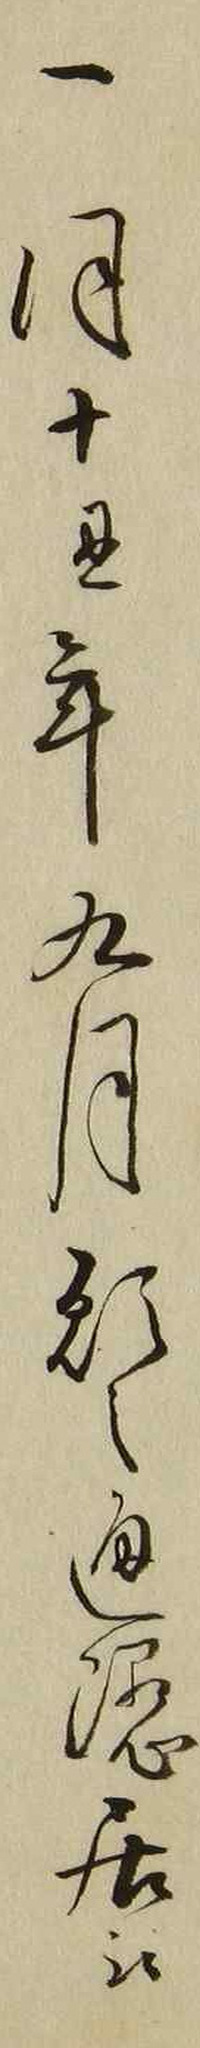一同十丑年九月願之通隠居被
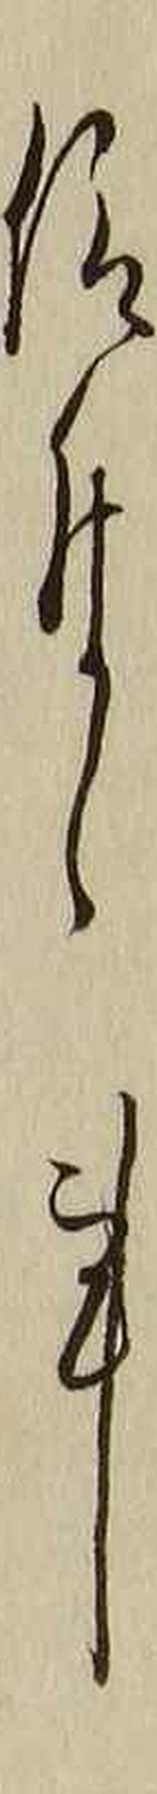仰付候事
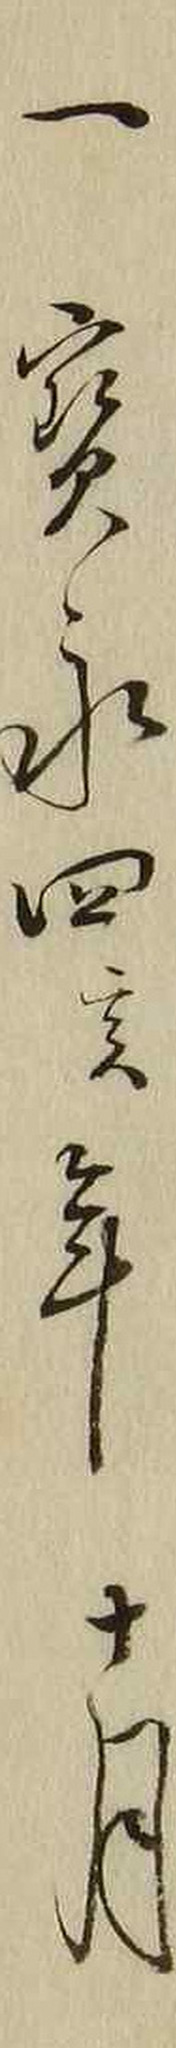一宝永四亥年十月
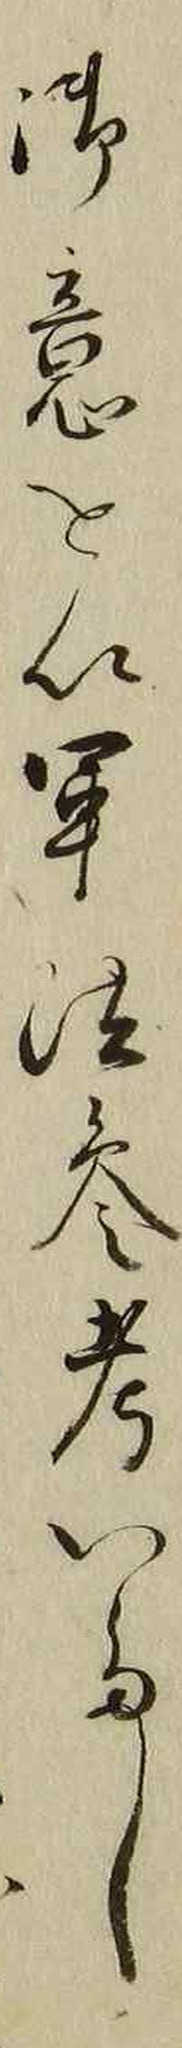御意を以軍法参考いたし
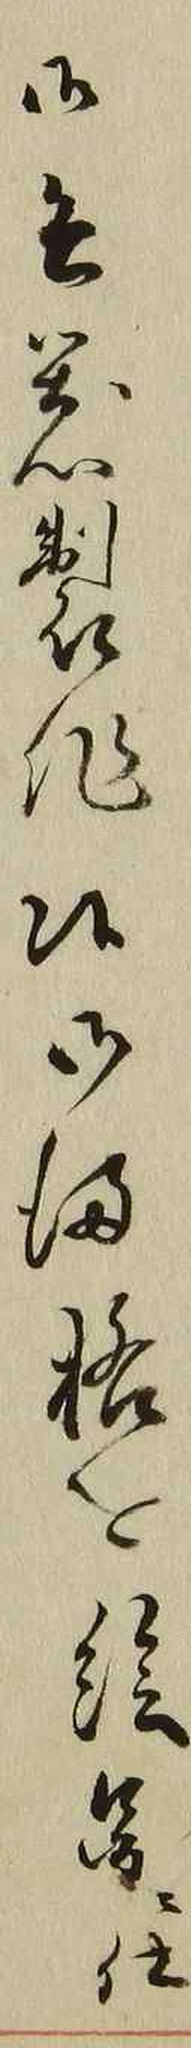御兵器製作候御備格を絵図ニ仕
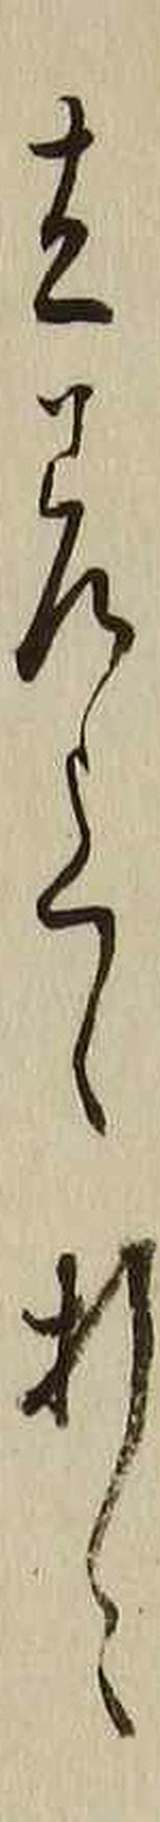尤差上候折々
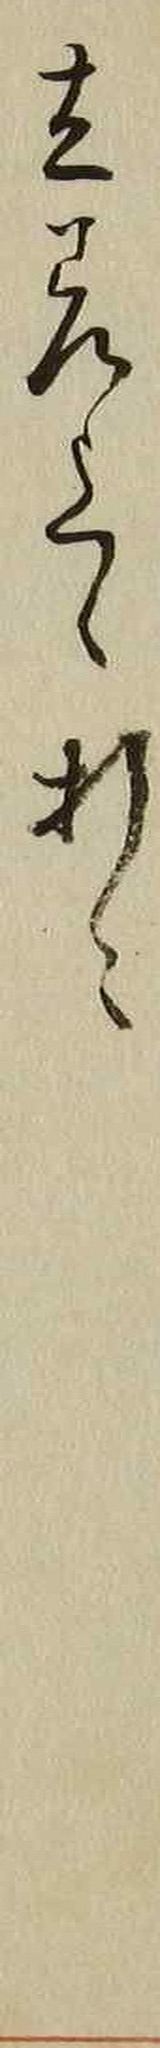尤差上候折々
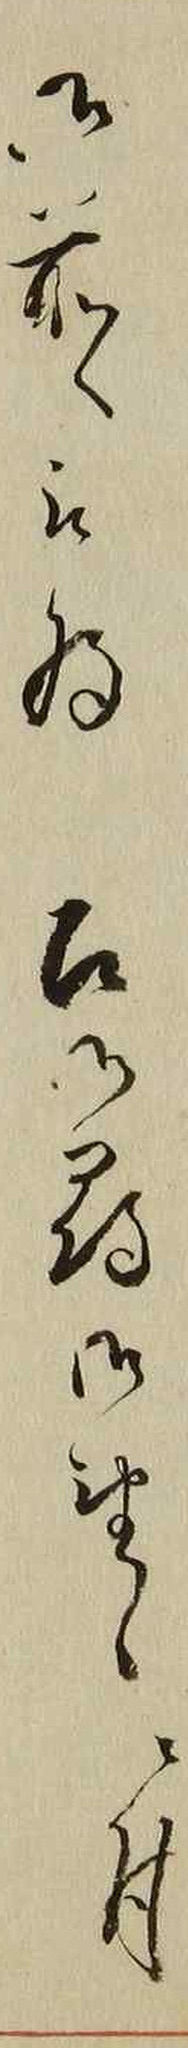御前へ被為召御尋御坐候ニ付
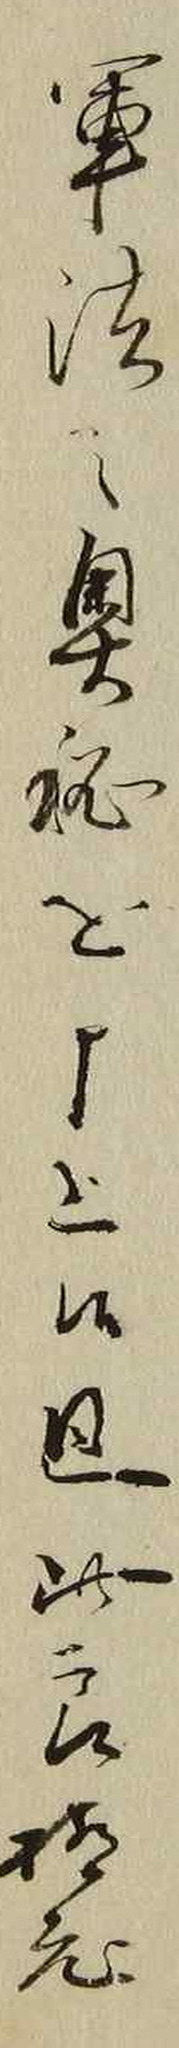軍法之奥秘を申上候且此節極老
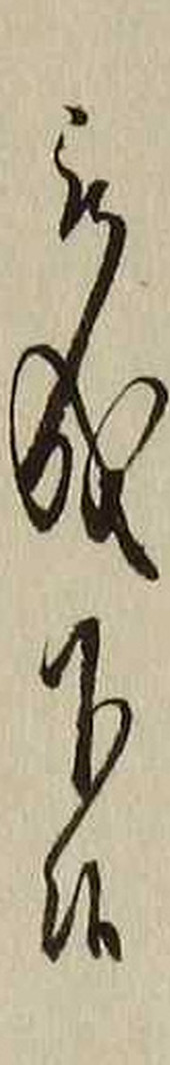被成下候
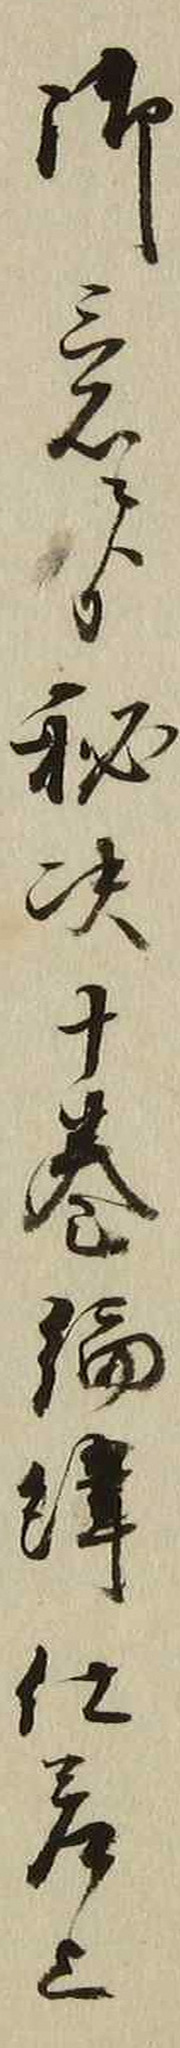御意ニより秘決十巻編輯仕差上
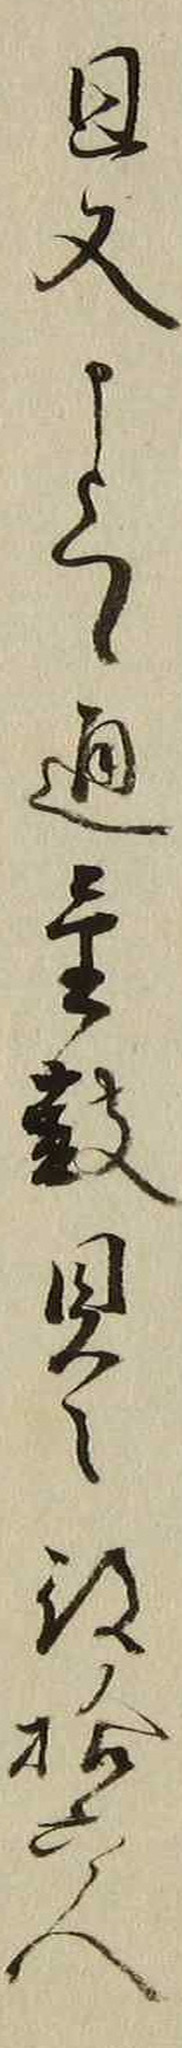且又申上候金皷貝之役拾六人
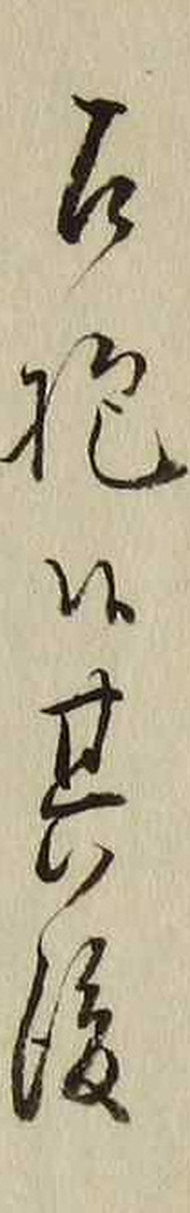召抱候其後
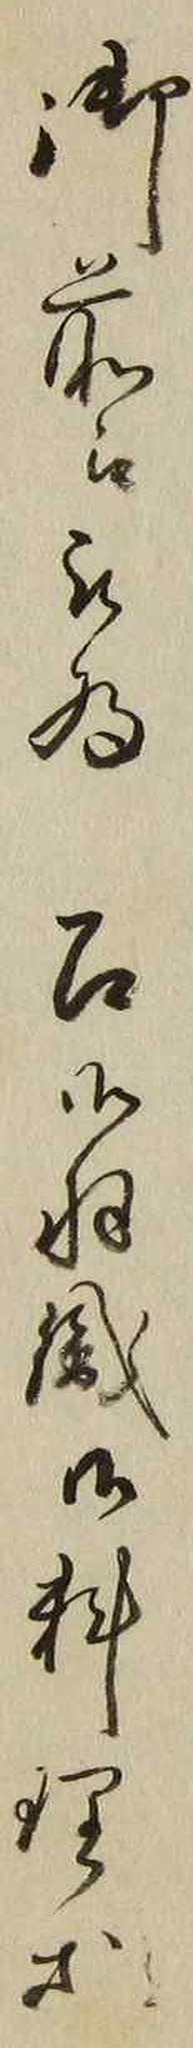御前江被為召御羽織御料理等
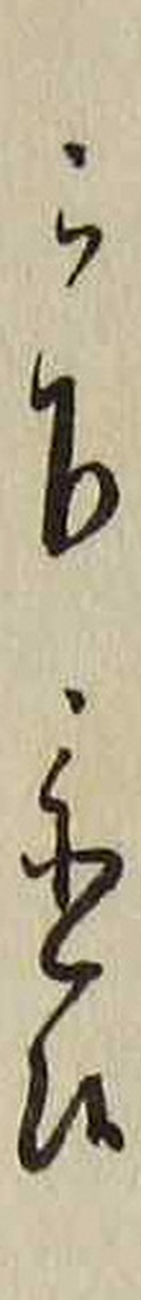被下置候
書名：諸士系譜　巻之1　い之部1
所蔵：会津若松市立会津図書館
